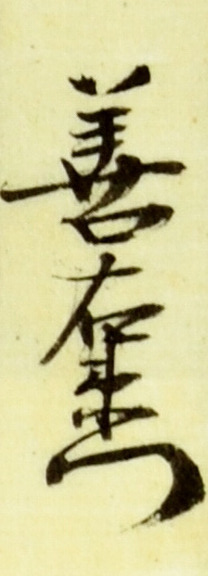善右衛門
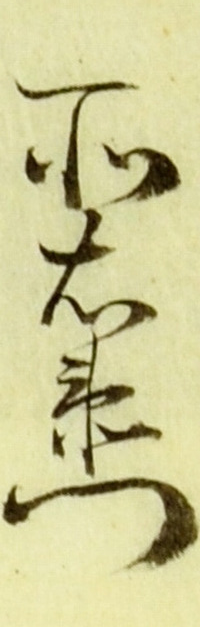所右衛門
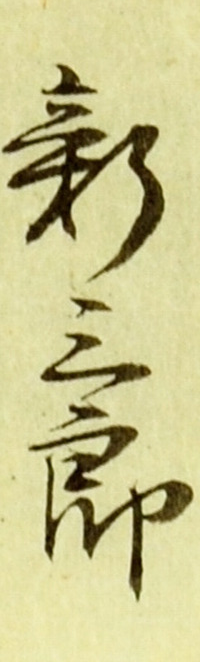新三郎
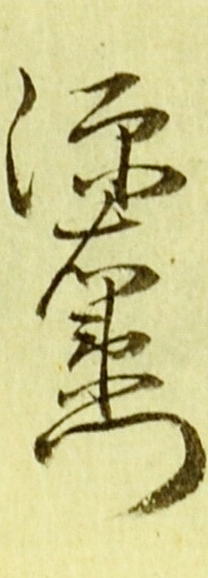源右衛門
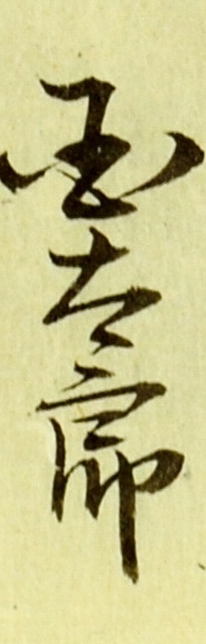国太郎
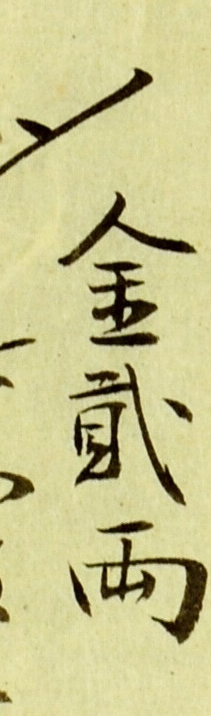〆金弐両
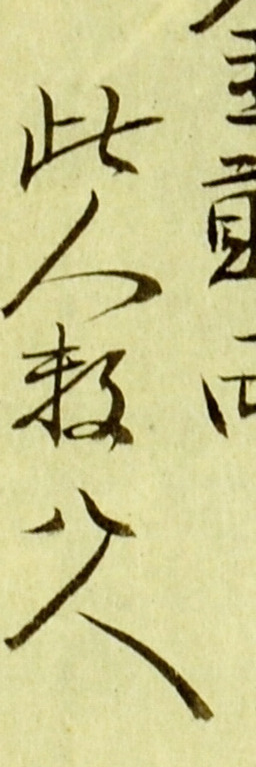此人数八人
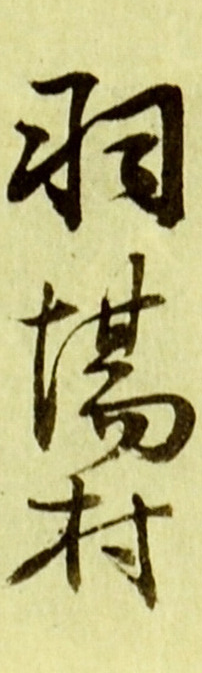羽場村
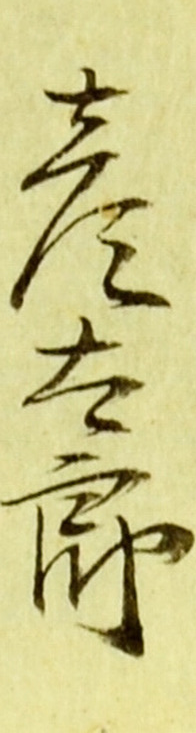彦太郎
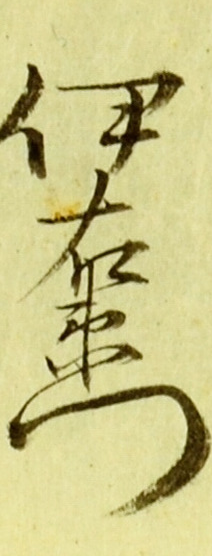伊右衛門
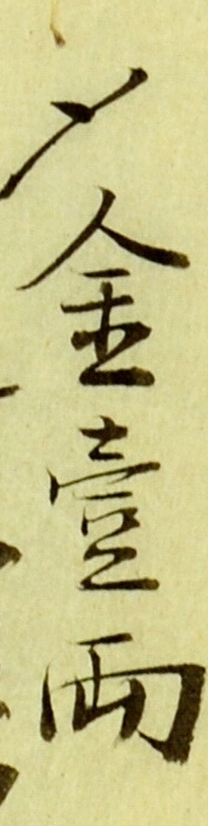〆金壱両
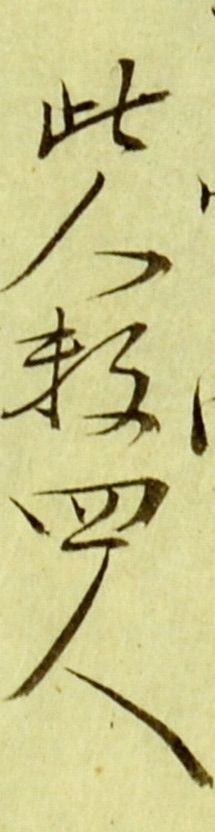此人数四人
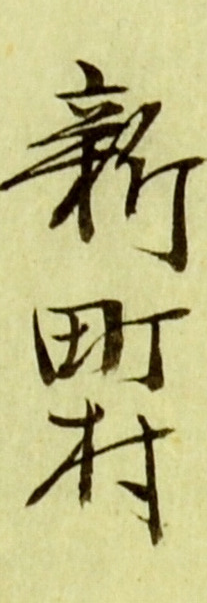新町村
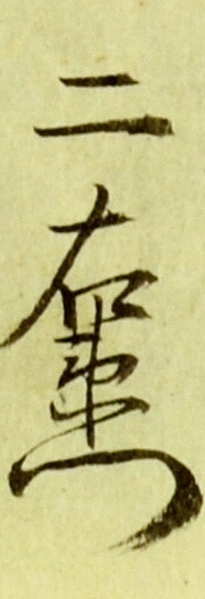二右衛門

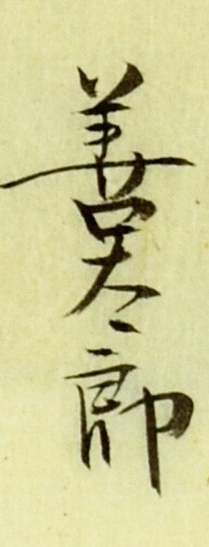善太郎
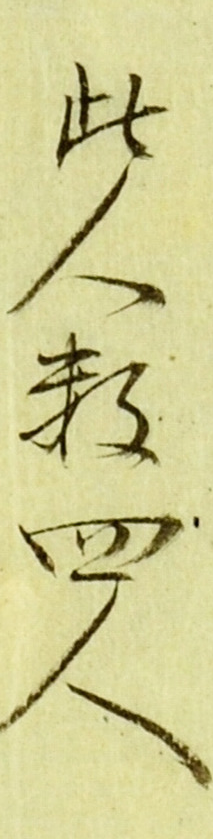此人数四人
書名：上伊那郷諸運上取調帳
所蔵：伊那市立高遠町図書館・合同会社AMANE
